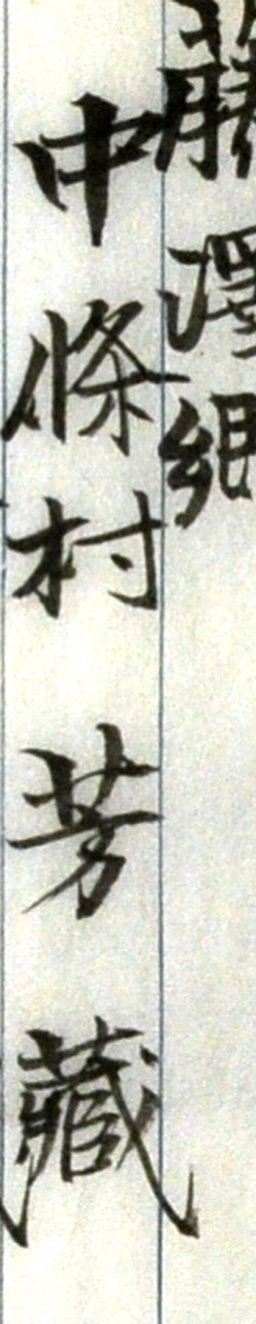中條村芳蔵
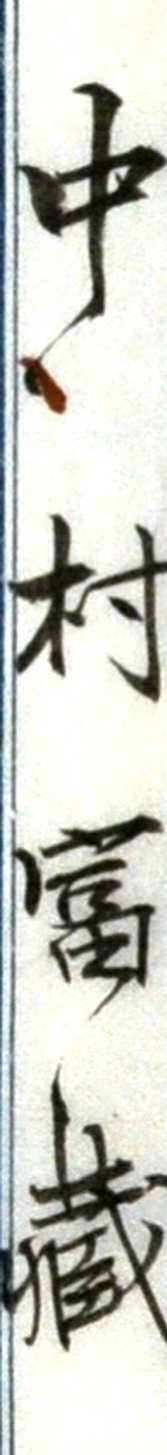中村富蔵
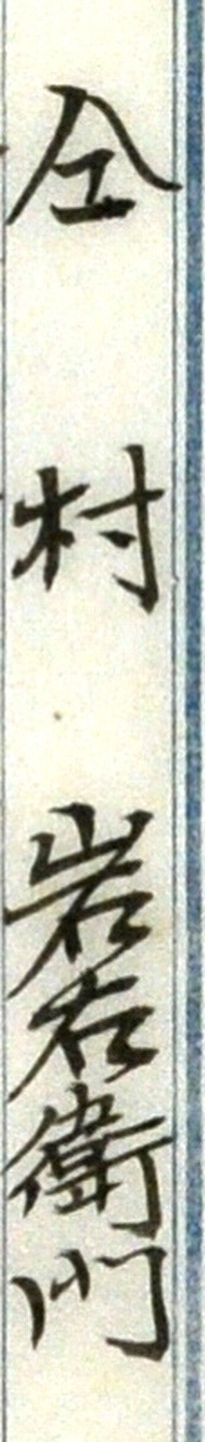同村岩右衛門
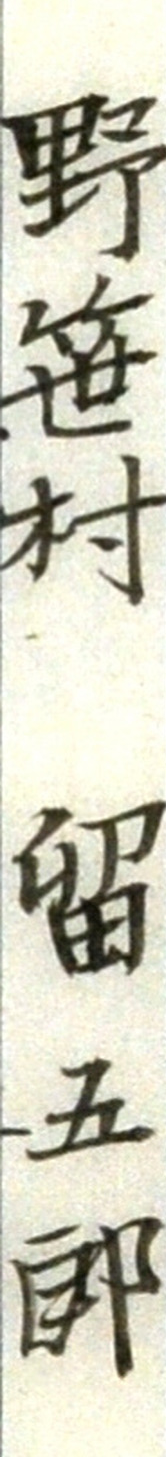野笹村留五郎
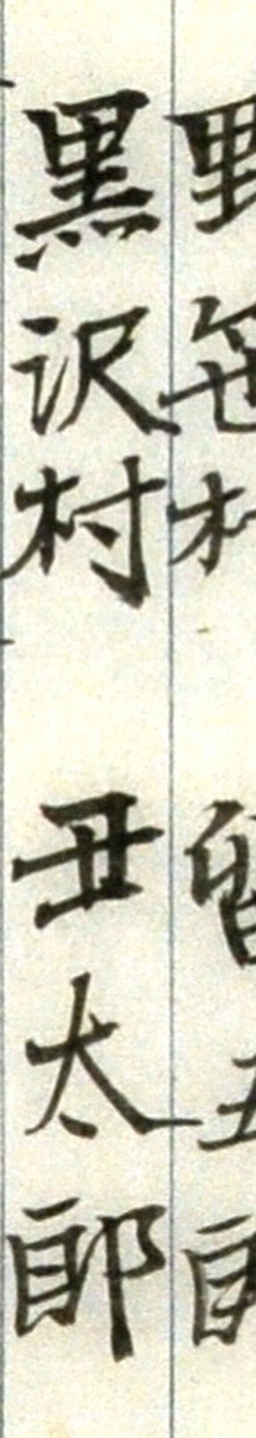黒沢村丑太郎
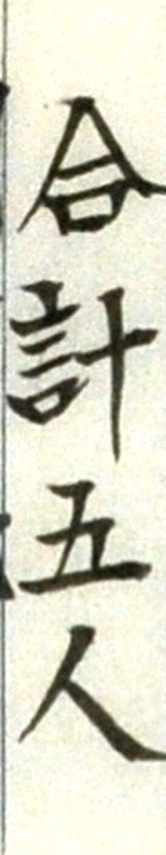合計五人
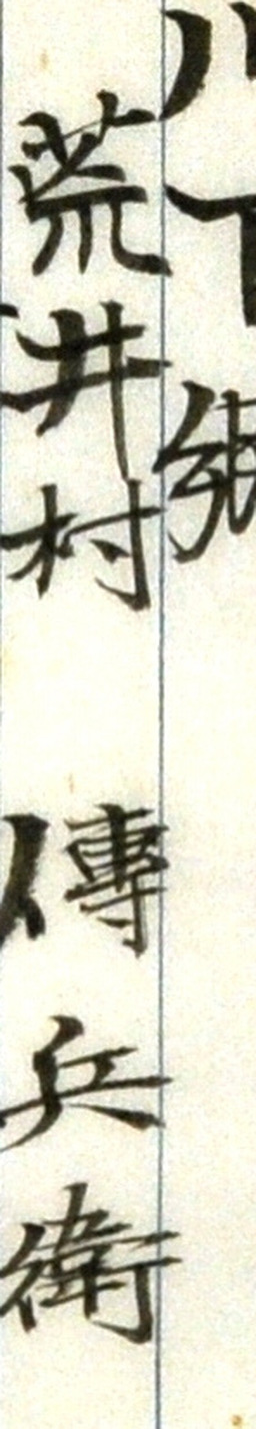荒井村伝兵衛
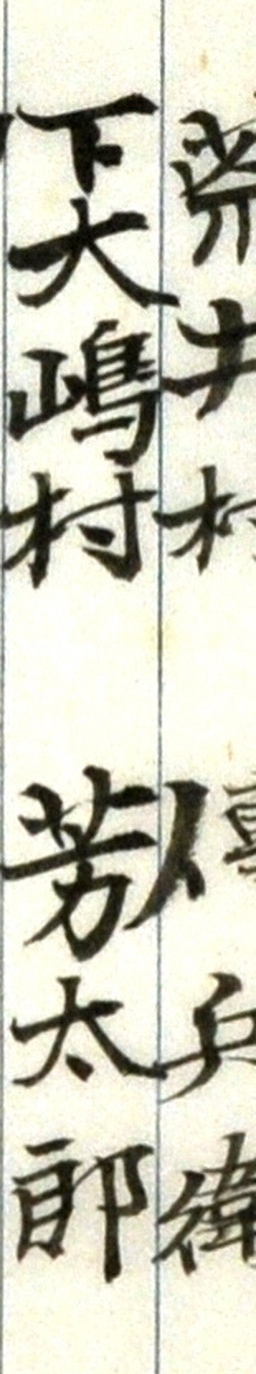下大嶋村芳太郎
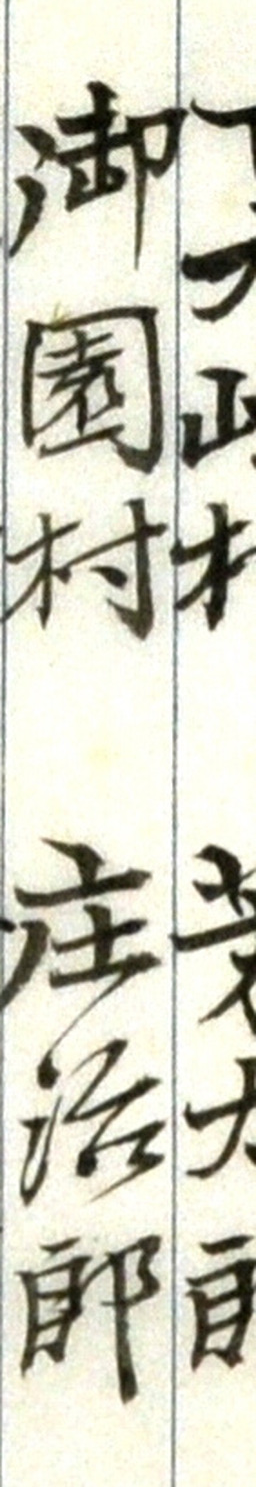御園村庄治郎
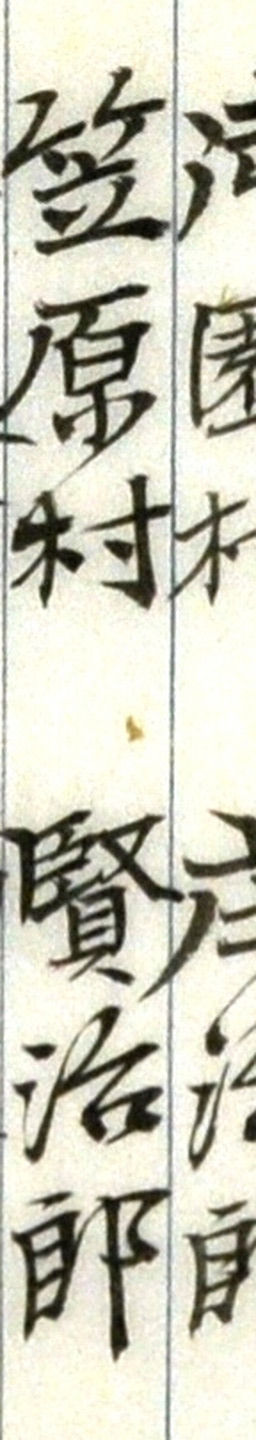笠原村賢治郎
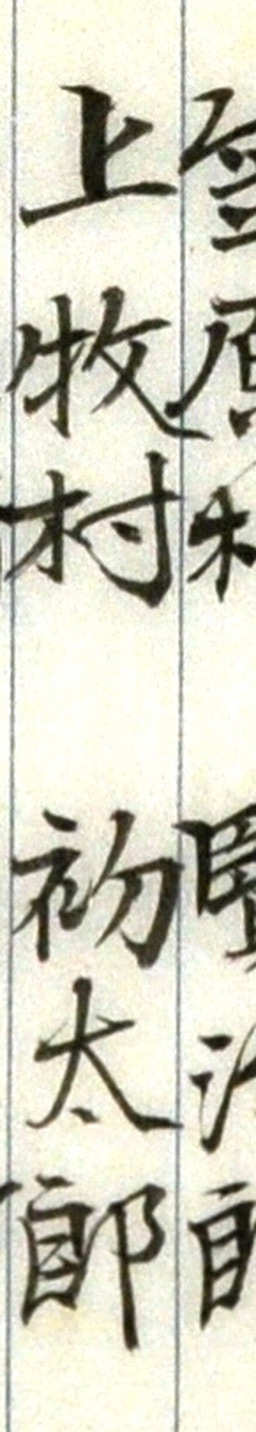上牧村初太郎
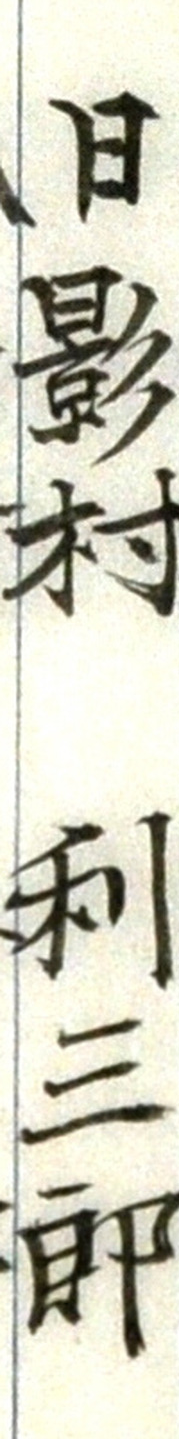日影村利三郎
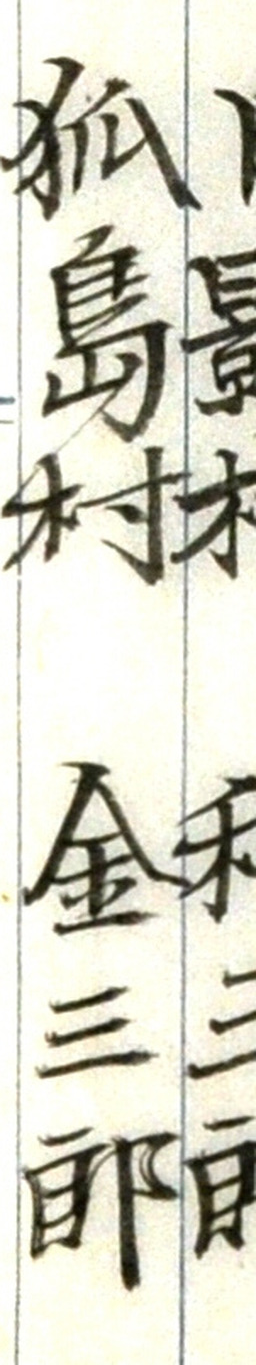狐島村金三郎

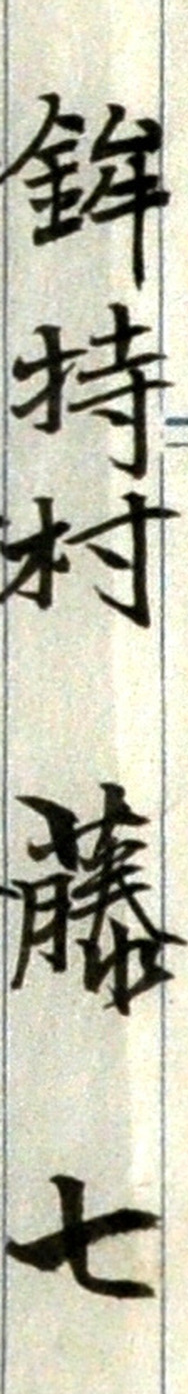鉾持村藤七
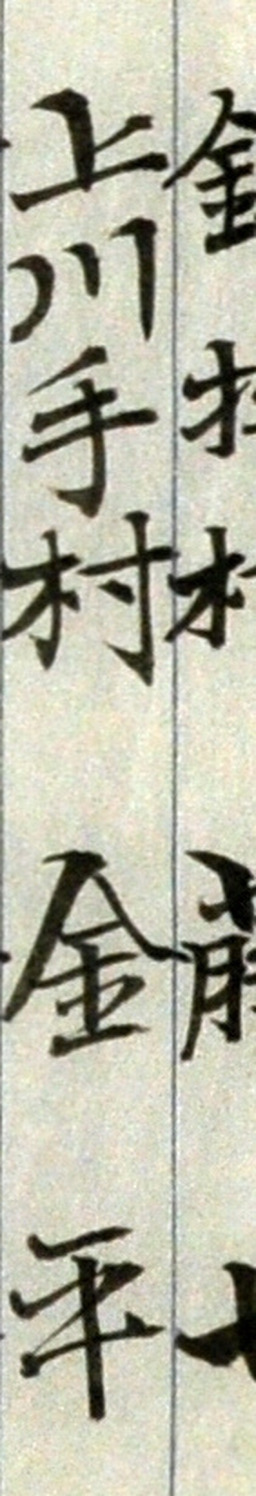上川手村金平
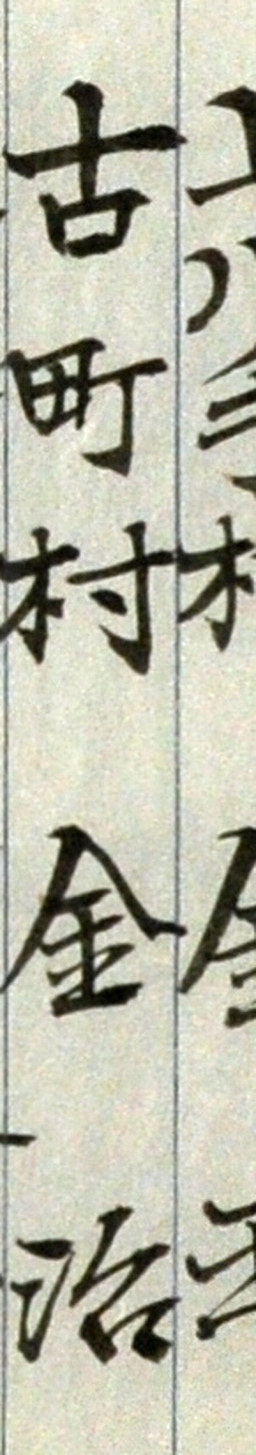古町村金治
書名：高遠藩兵員名簿歩兵銃隊・郷村募集員
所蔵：伊那市立高遠町図書館・合同会社AMANE
